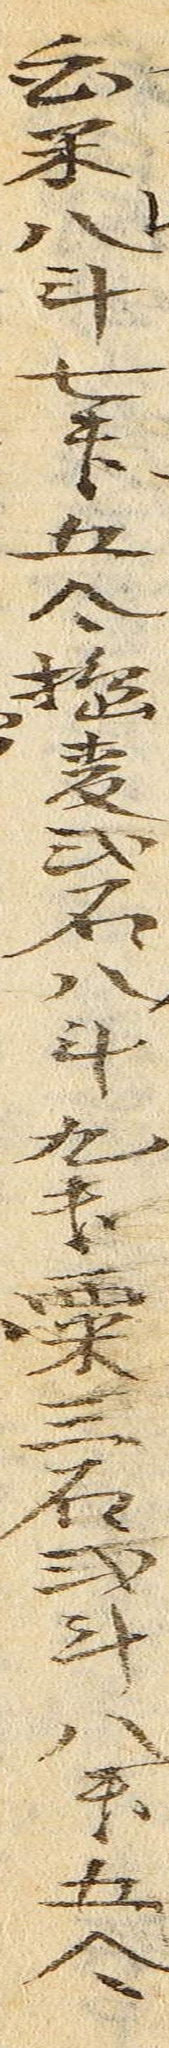白米八斗七升五合搗麦弐石八斗九升粟三石弐斗八升五合
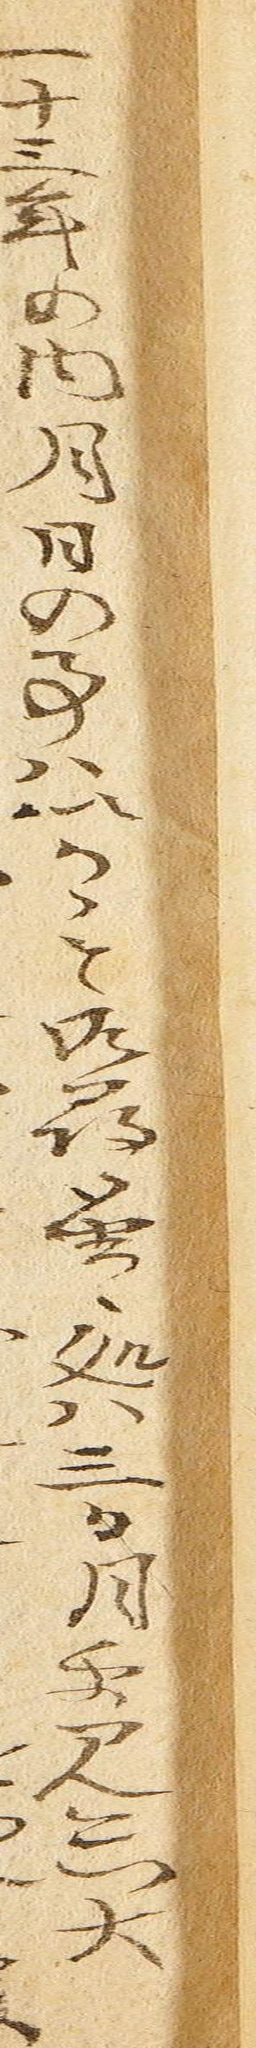一十三年の内月日の事ハいかゝと御尋御座候処ハ三日月を見合大
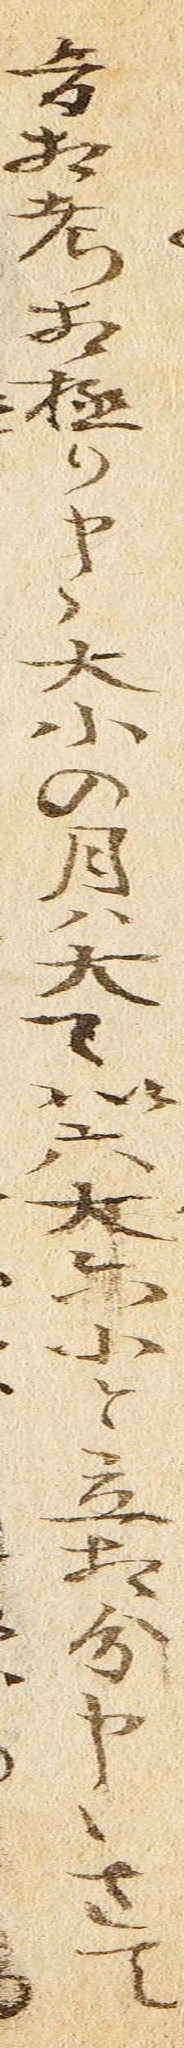旨相考相極り申候大小の月ハ大てい六大六小と立相分申候さて
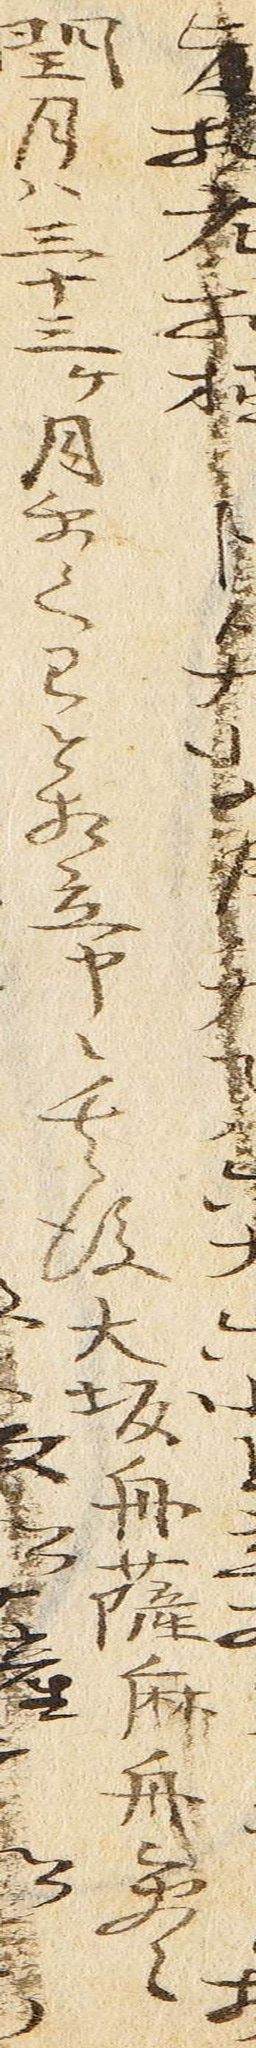閏月ハ三十三ケ月をくわと相立申候其後大坂舟薩摩舟参候
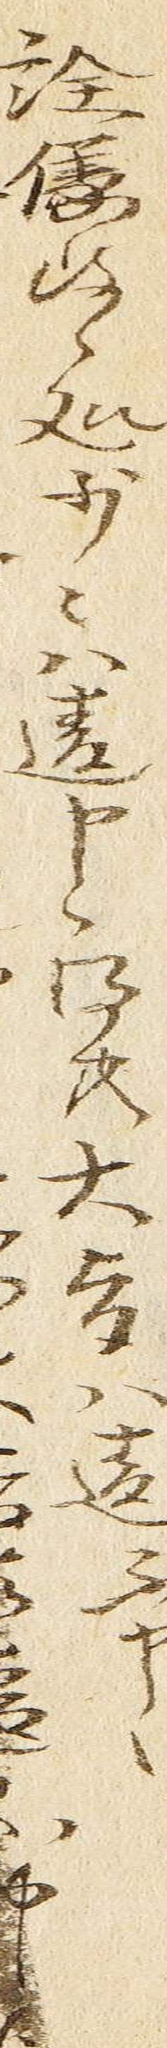詮儀致候処少々ハ違申候得共大旨ハ違不申候
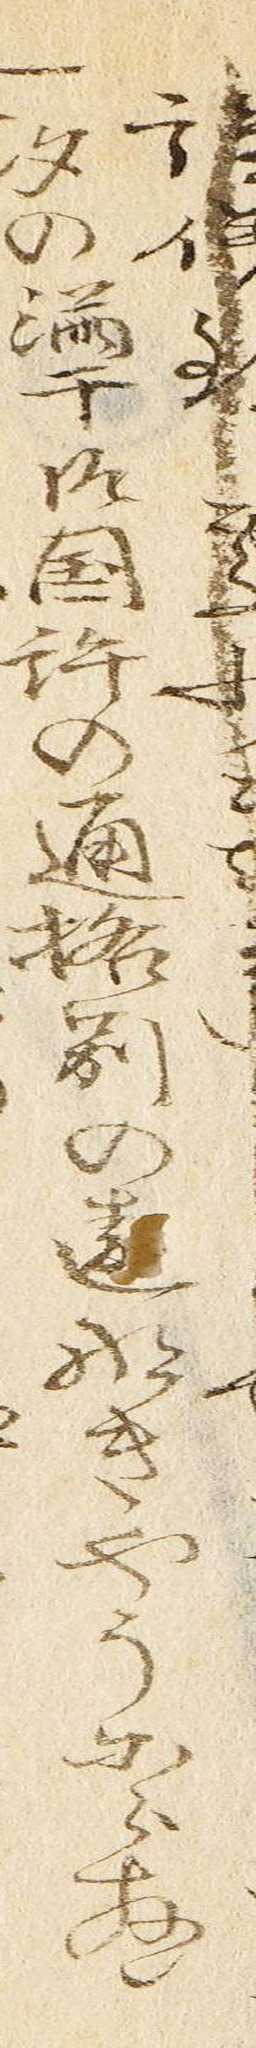一汐の満干御国許の通格別の違なきやうに被存候
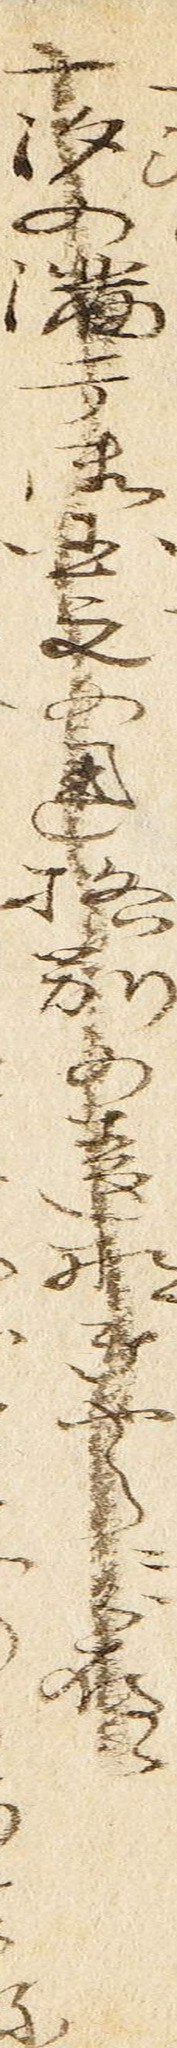一汐の満干御国許の通格別の違なきやうに被存候
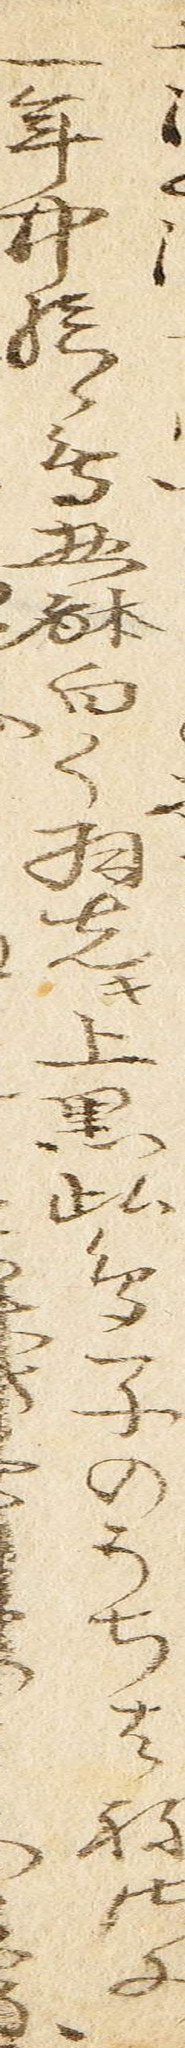一年中給候鳥惣体白く羽先キ上黒此鳥子のうちはねつみ
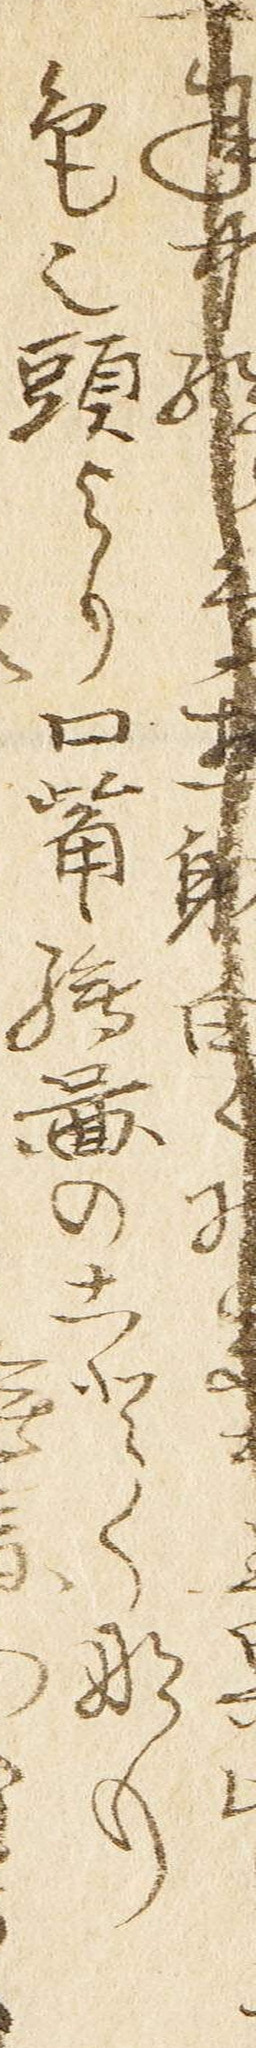色の頭より口觜絵図のことくなり
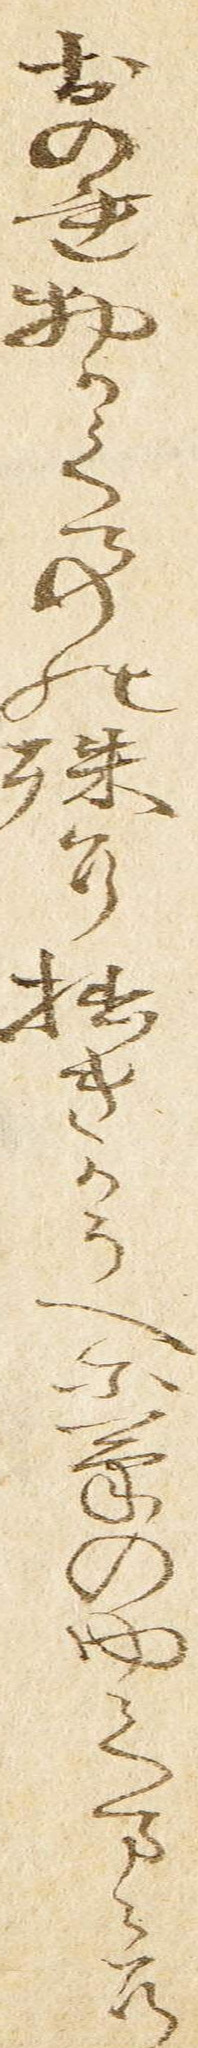おのれ物かく事の殊に拙きかうへに筆のゆくまゝに
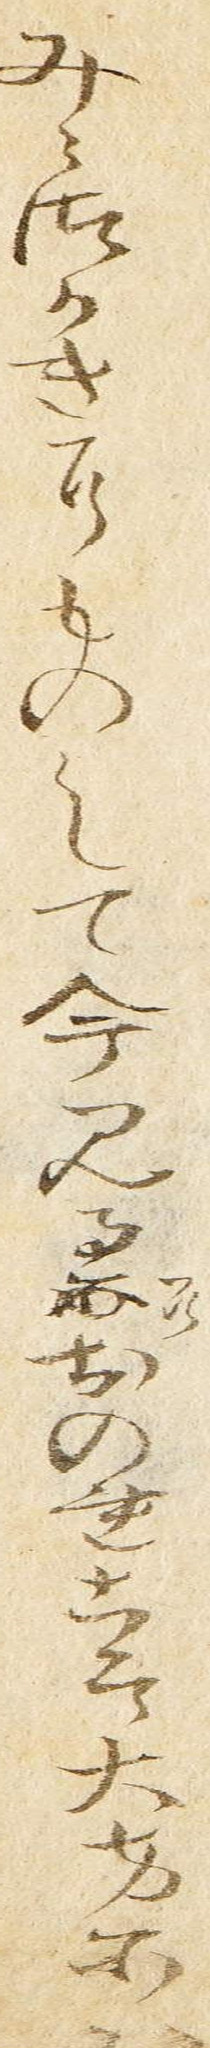みゝつかきにものして今見るにおのれこそ大方にハ
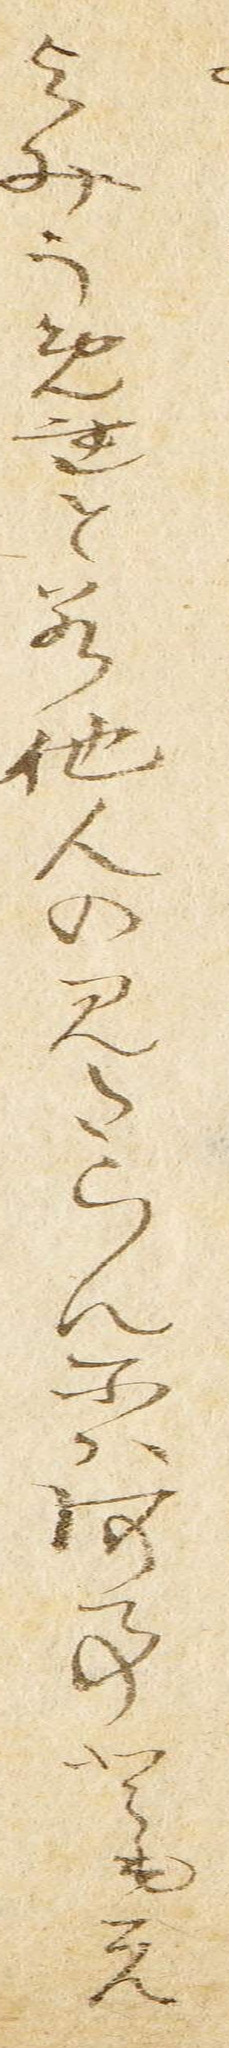よみうめれと若他人の見たらんにハ何事ともえ
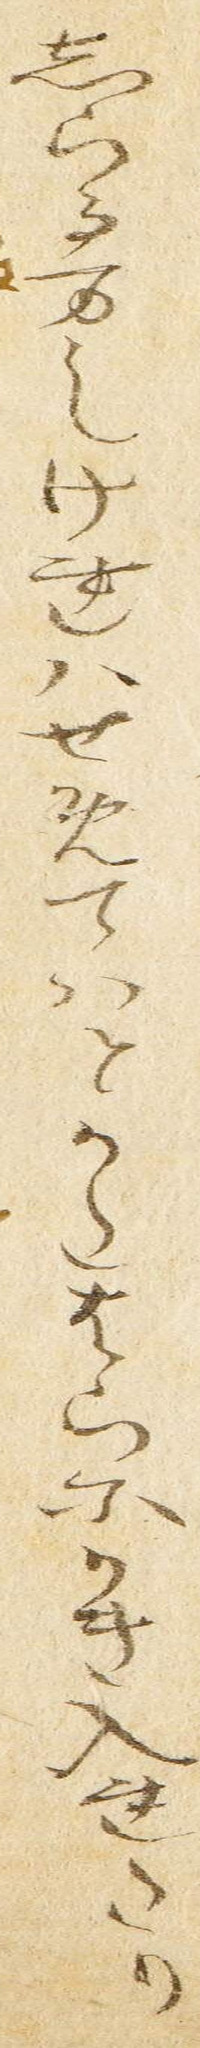しらるましけれハせめてハとかたはらにかき入れたり

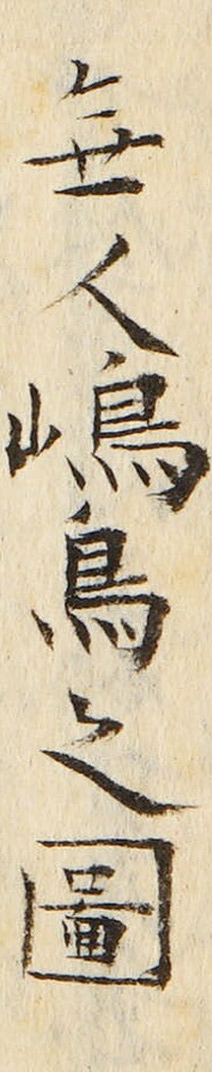無人嶋鳥之図
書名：無人島漂流書付
